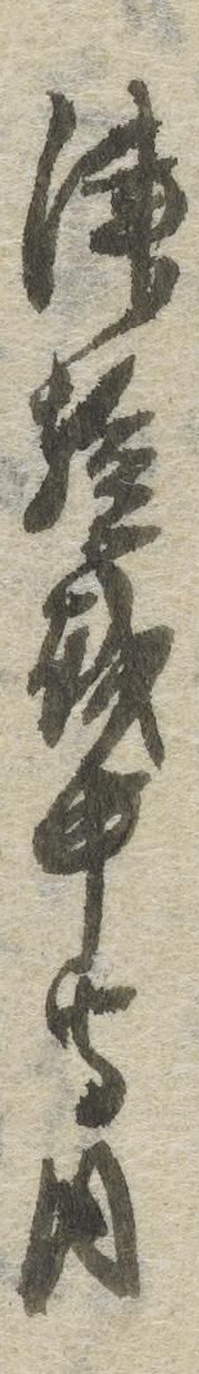津軽越中守内
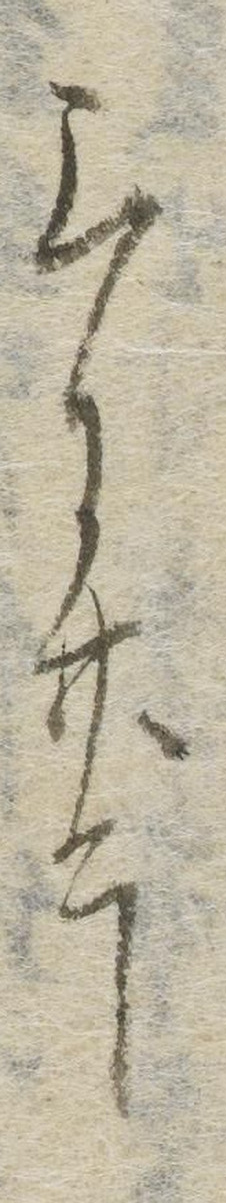三月廿二日
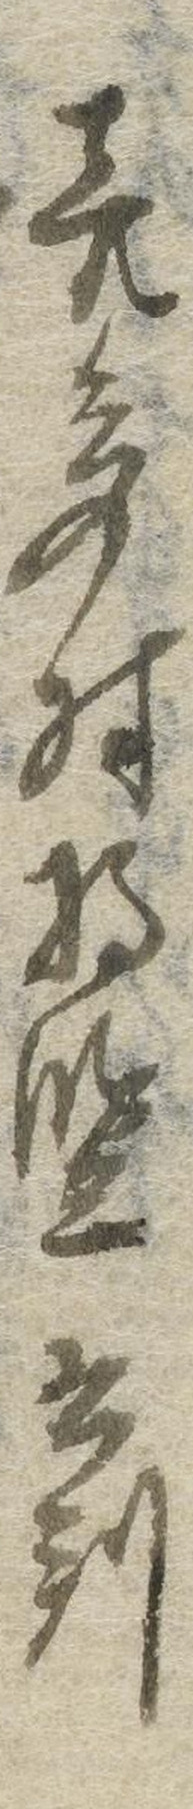喜多村将監書判
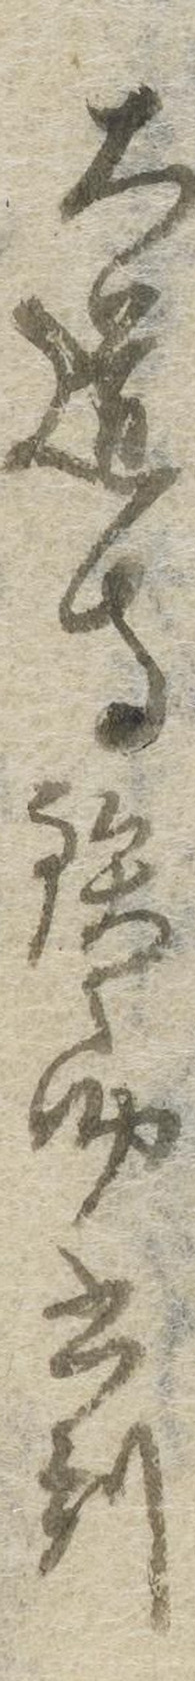大道寺鉄之助書判
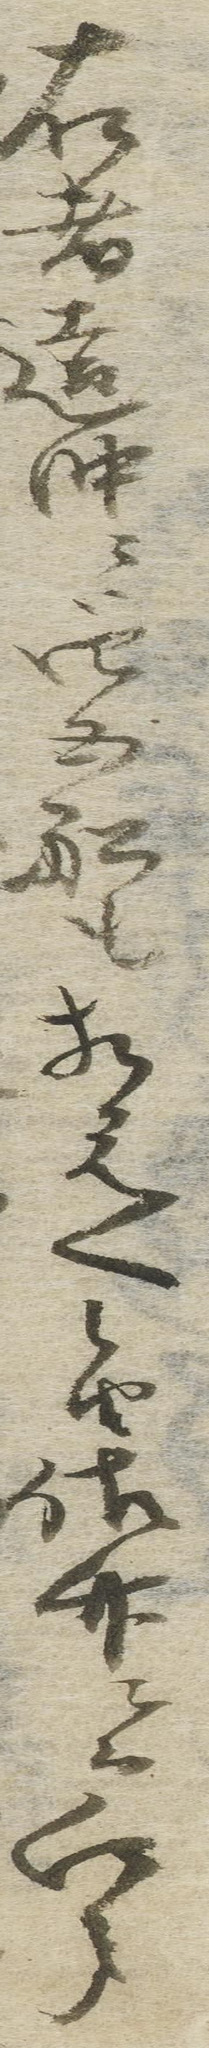右は遠沖二ハ四五船も相見へ候由佐竹二而江戸
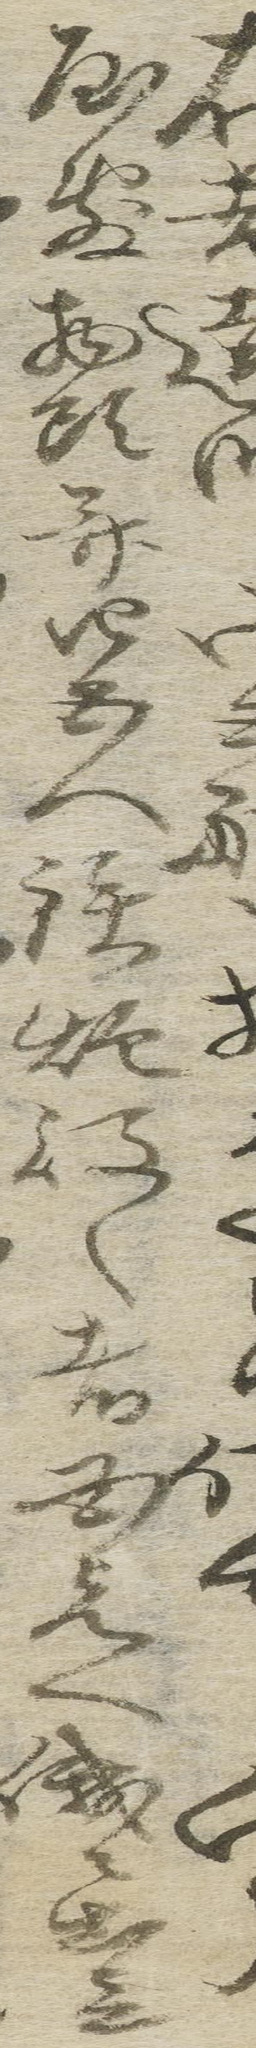屋敷物頭并四五人鉄砲役之者国元へ俄二出立
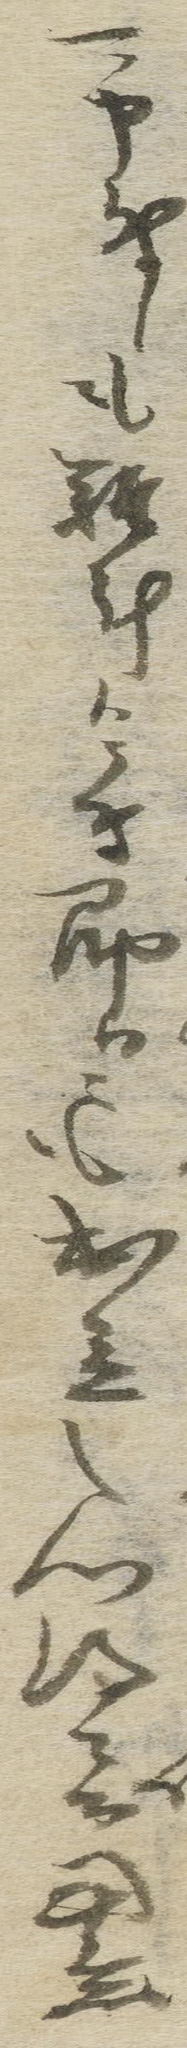可申付も難計候二付即日二も出立之心得二而用意

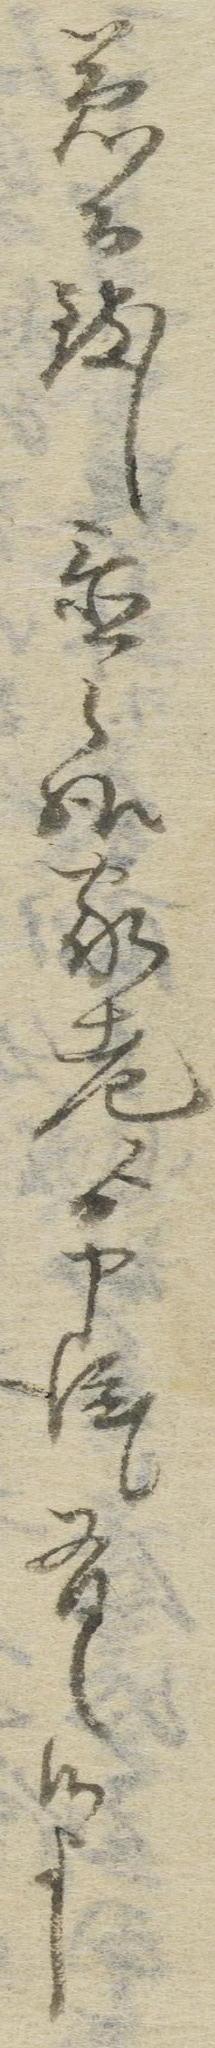兼而致し置候様家老ゟ申渡し有之候よし
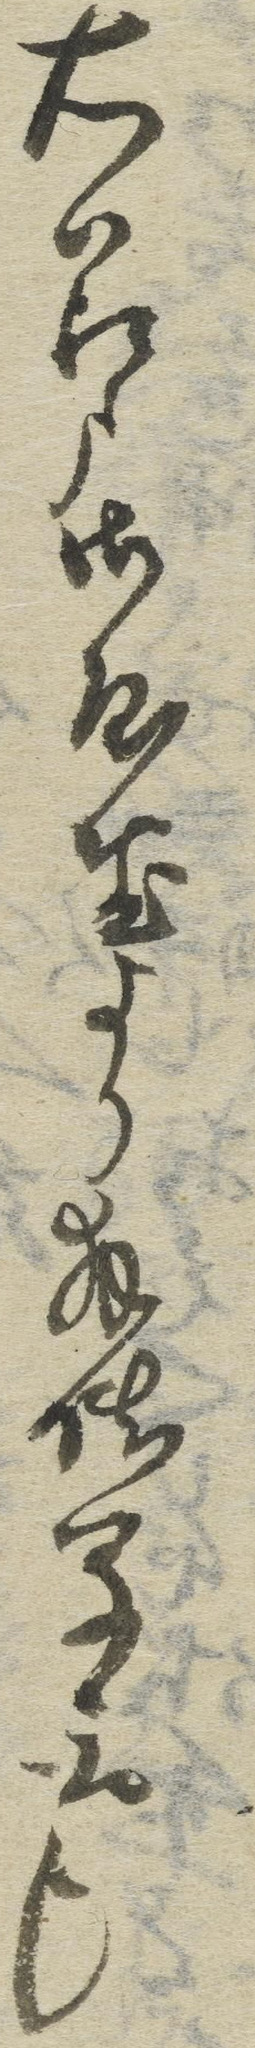右ハ江戸御屋敷より拝借写取申候
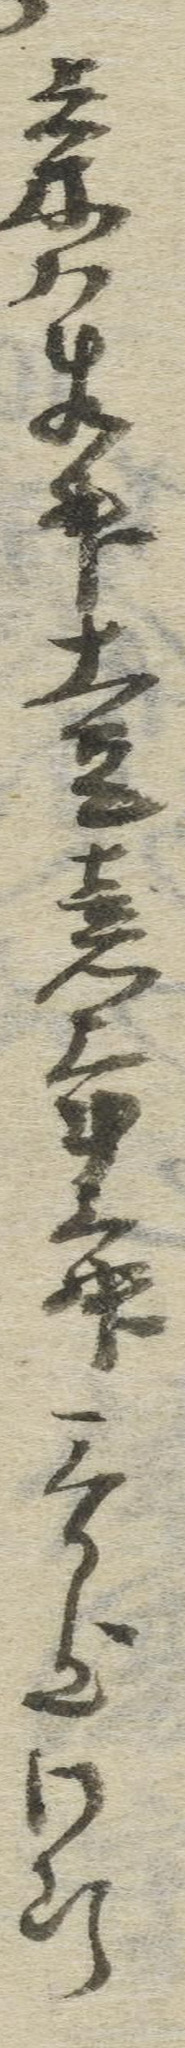上米八斗九升大豆壱石三斗三升三月迄同断
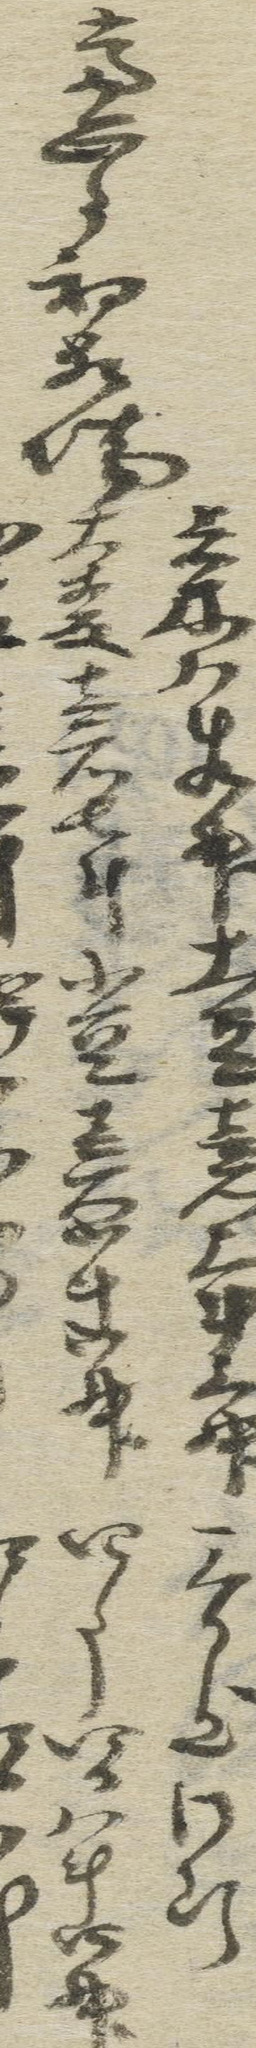当酉之初相場大麦壱石七斗小豆壱石弐斗弐升四月四日八斗四升
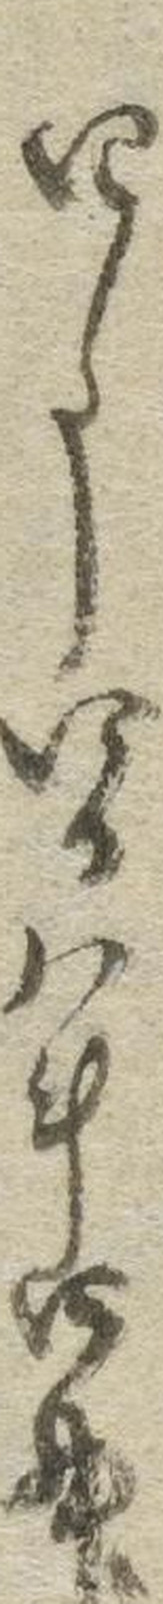四月廿四日七斗七升
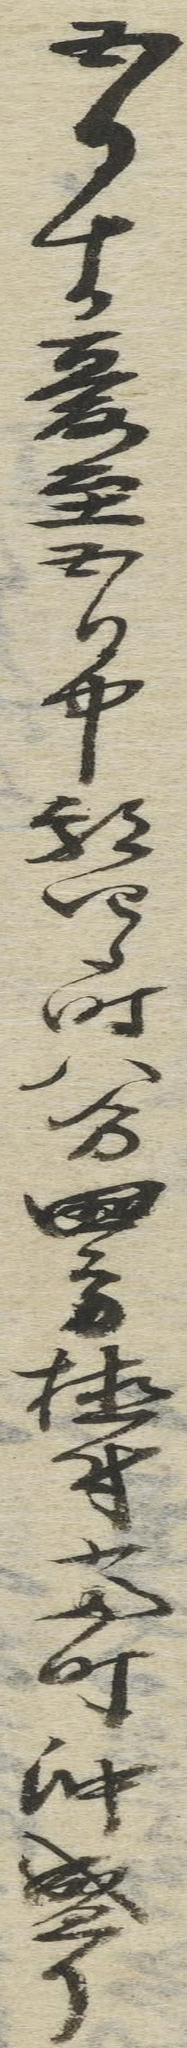五月十日夏至五月中朝四ツ時八分田方植付当時沖盛り
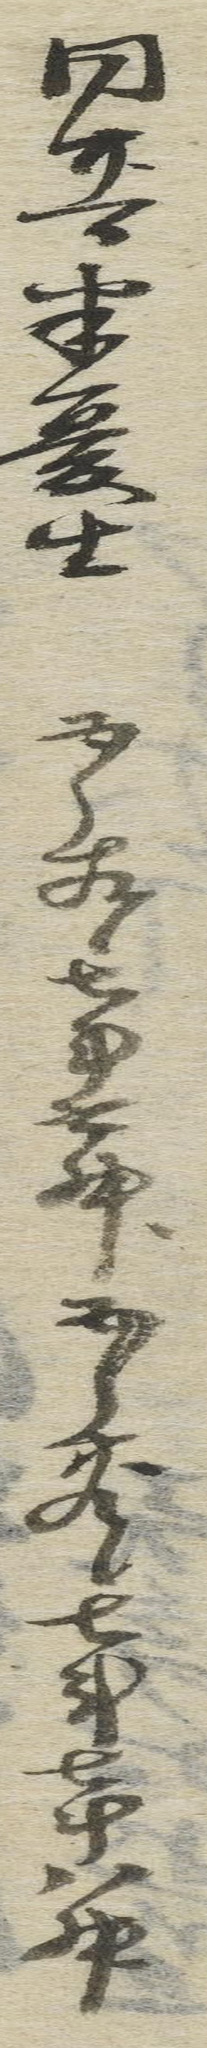同廿一日半夏生五月十九日七斗六升五月廿九日七斗七斗八升
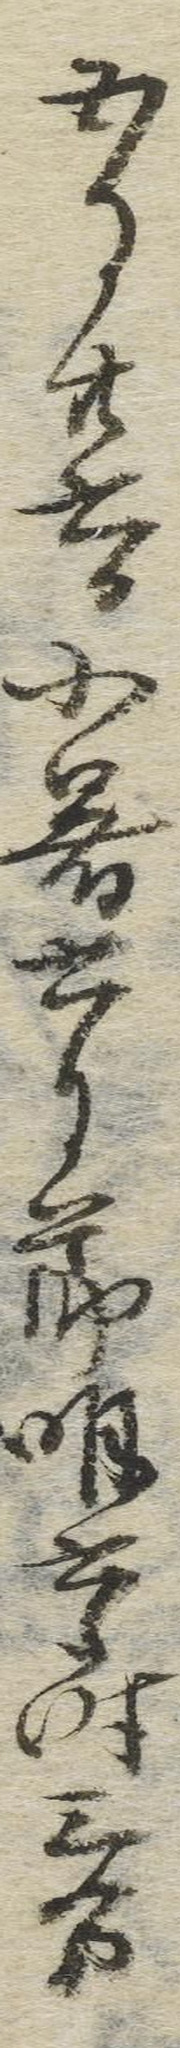五月廿六日小暑六月節明六ッ時三分
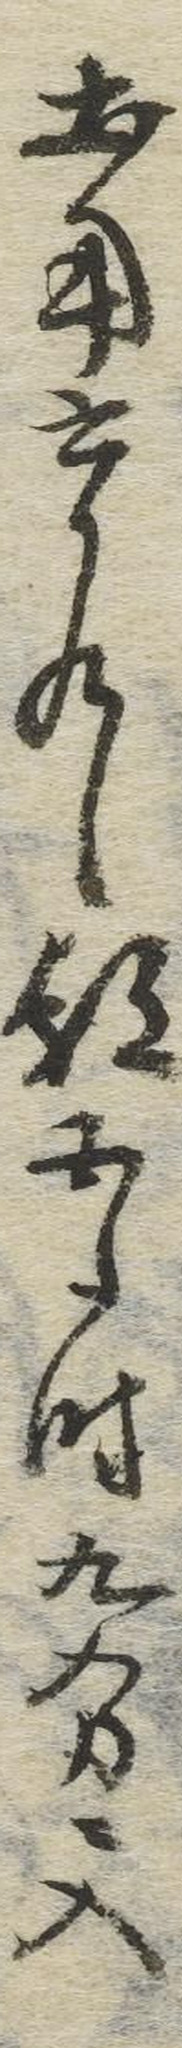土用六月九日朝五ツ時九分二入
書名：信濃越後　地震書留
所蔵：東京大学地震研究所図書室 Earthquake Research Institute Library, The University of Tokyo, JAPAN
